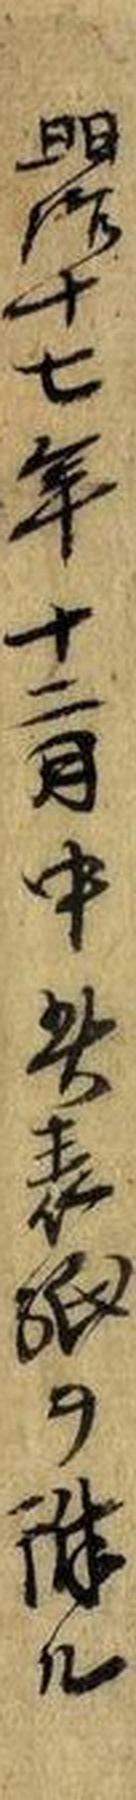明治十七年十二月中欠缺表紙ヲ附ル
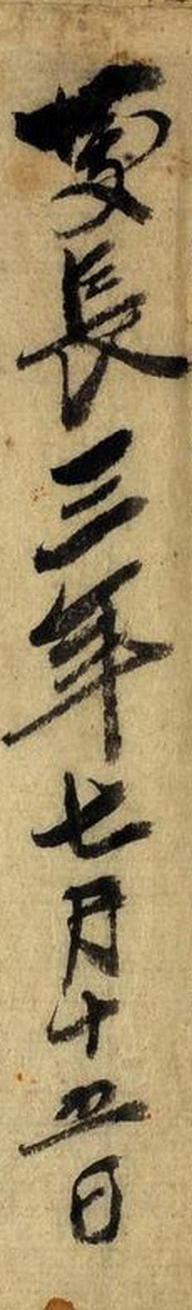慶長三年七月十五日
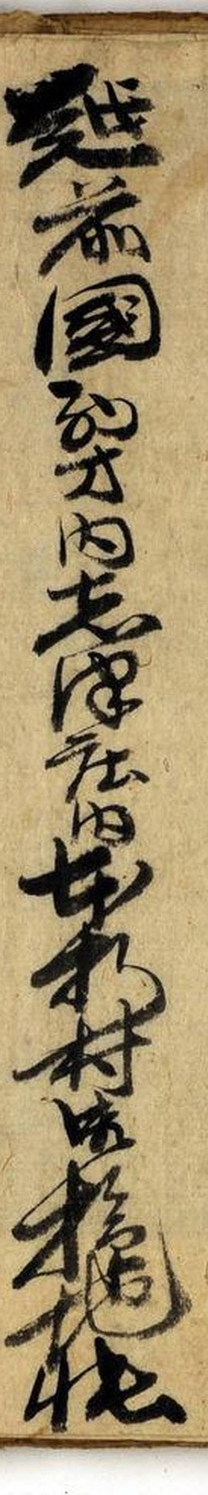越前国西方内志津庄内本折村御検地帳

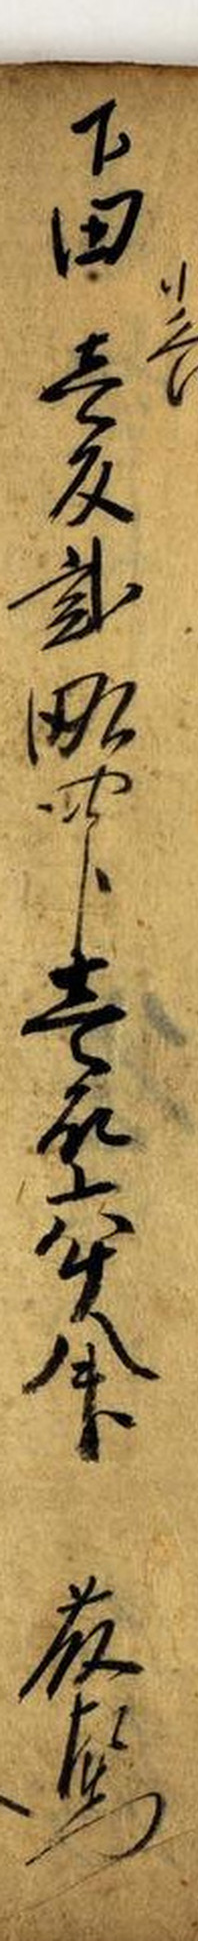下田壱反弐畝四分壱石六斗八升藤左衛門
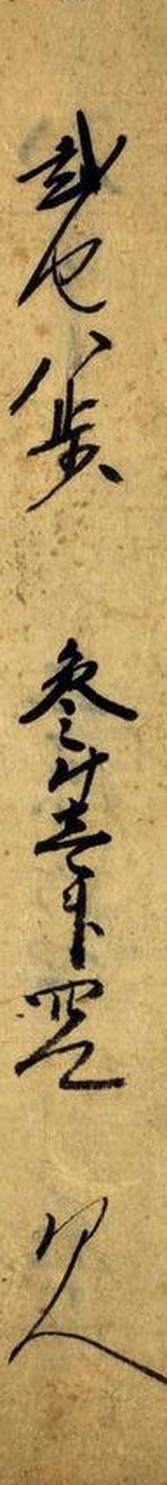同弐セ八歩参斗壱升四合同人
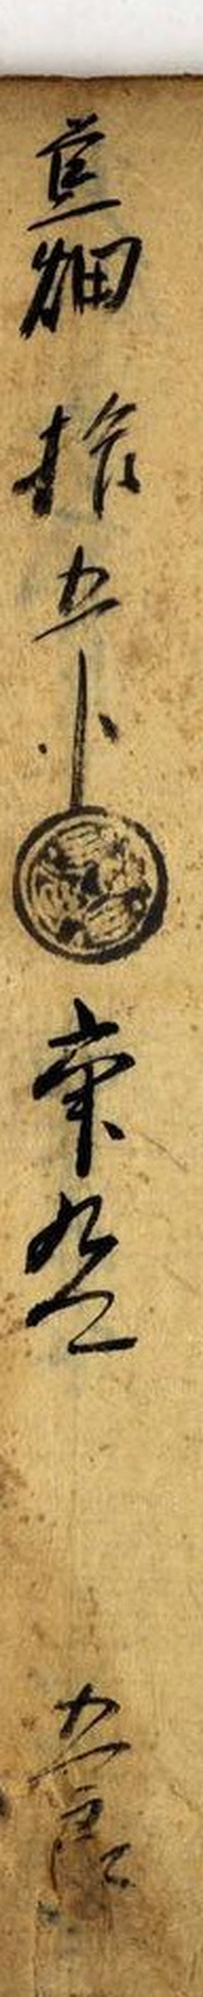荒畑拾五分㊞六升九合五郎
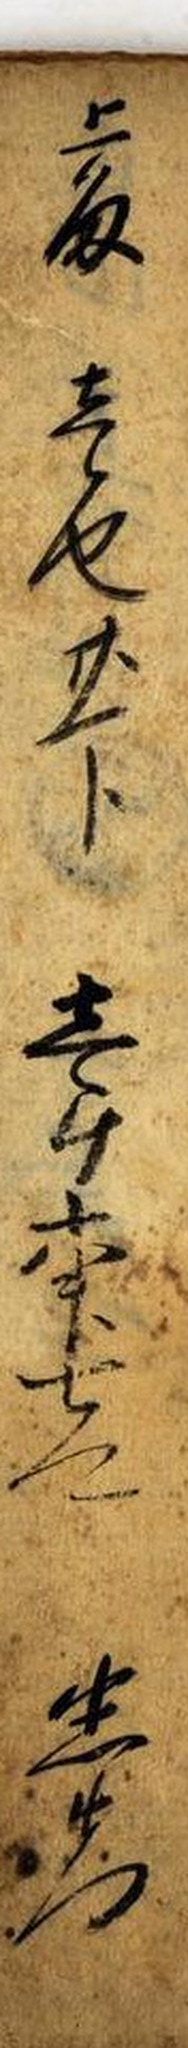上畠壱セ廿分壱斗六升七合忠右衛門
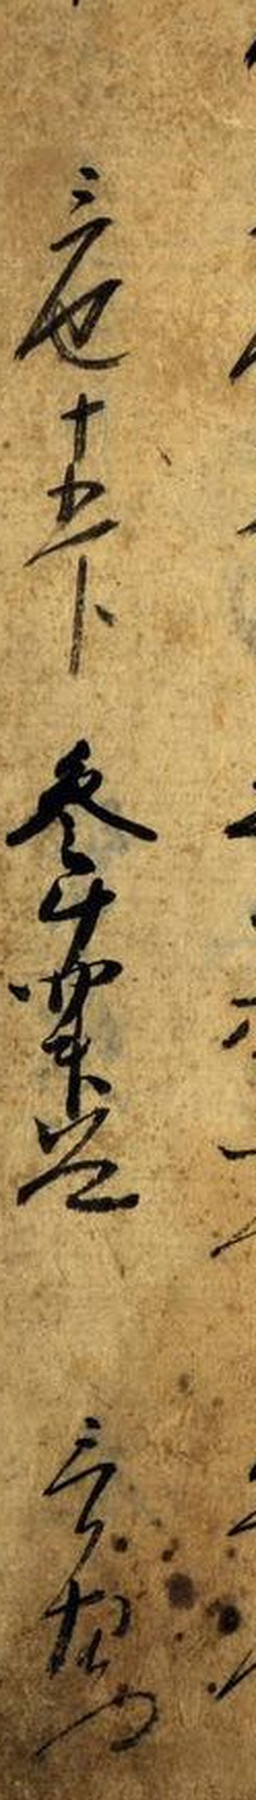同三せ十五分参斗四升八合三郎左衛門
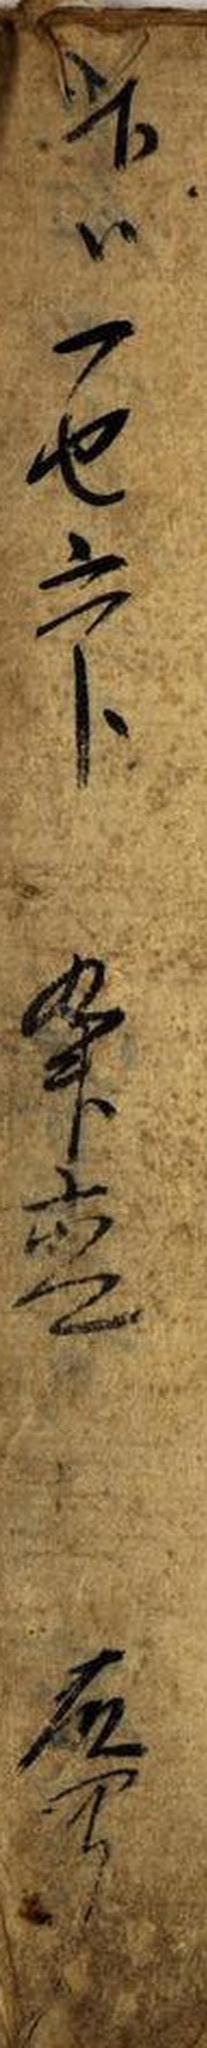下同一セ六分九升六合藤四郎

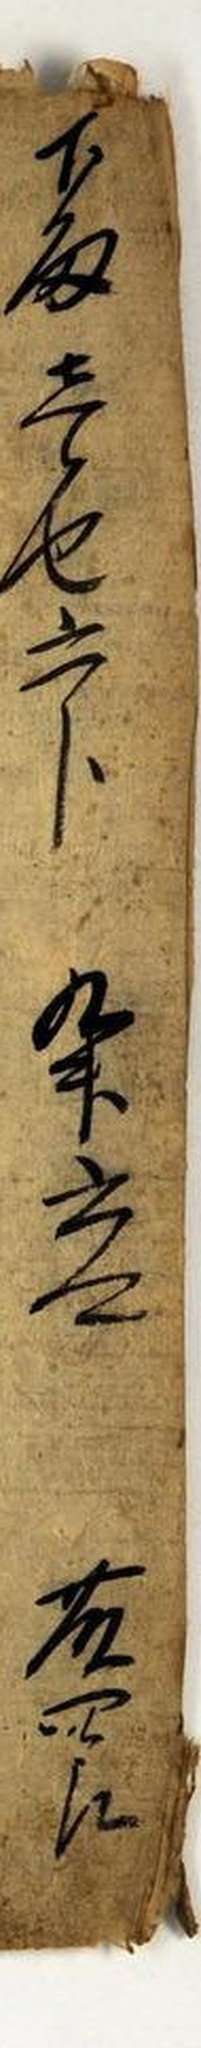下畠壱セ六分九升六合藤四郎
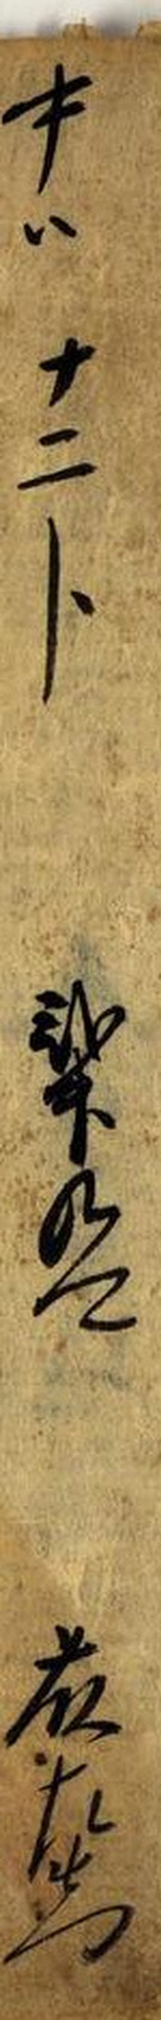中同十二分弐升九合藤左衛門
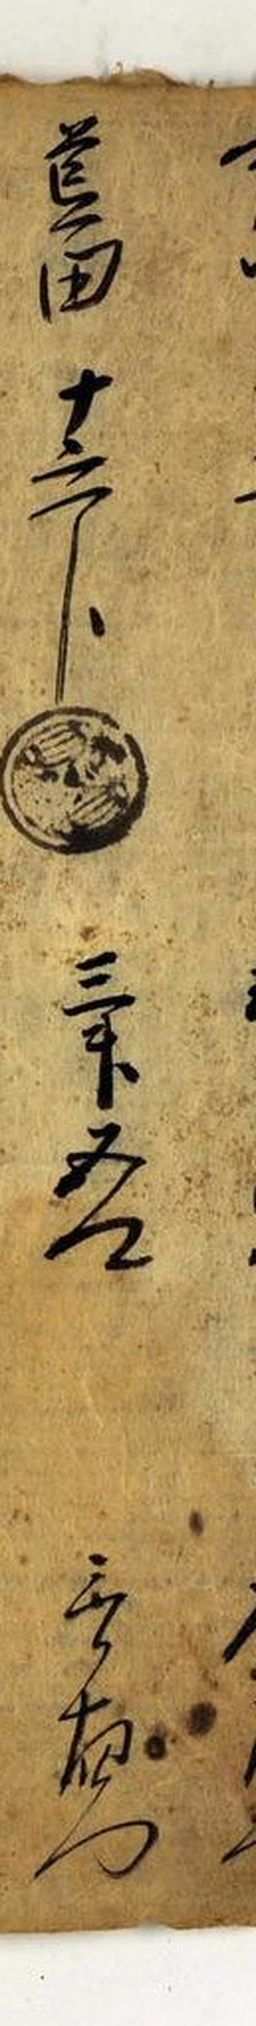荒田十六分㊞三升五合三郎左衛門
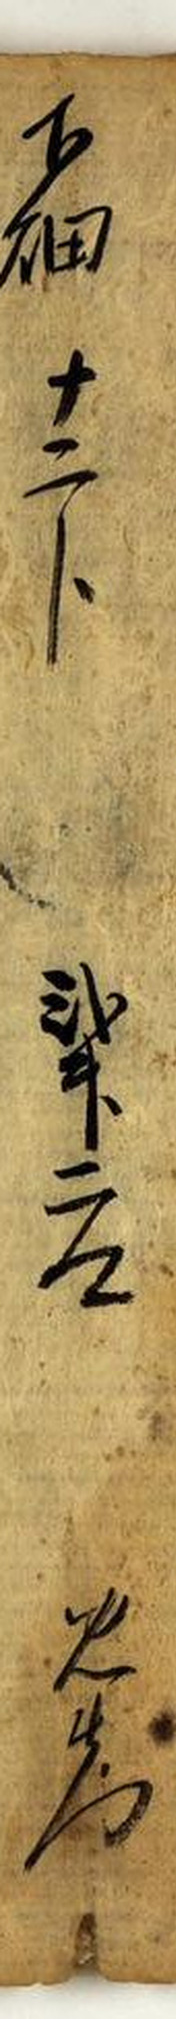下畑十二分弐升二合忠右衛門
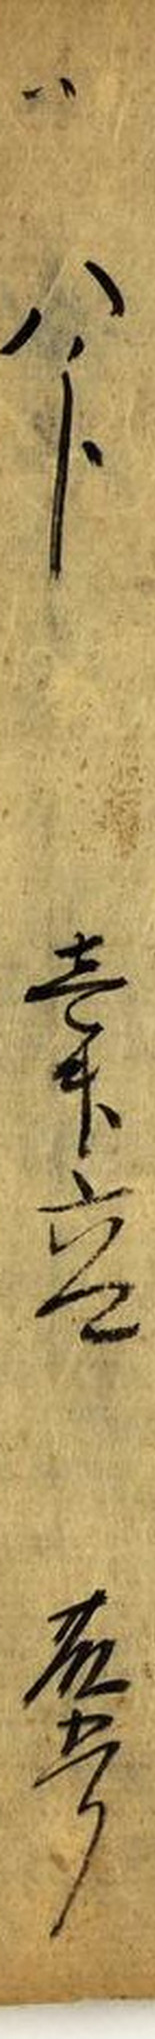同八分壱升六合藤五郎
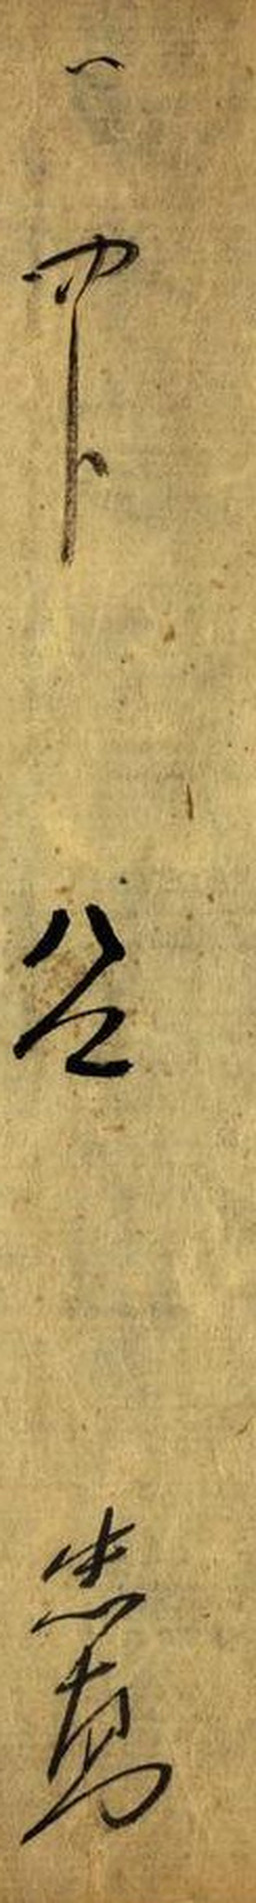同四分八合忠左衛門
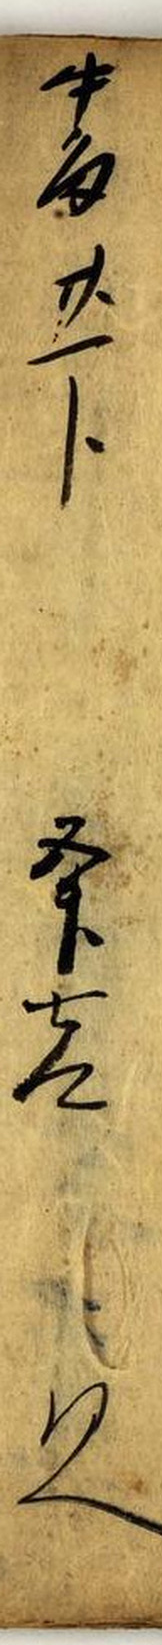中畠廿一分五升七合同人
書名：越前国西方内志津庄内本折村御検地帳
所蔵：福井県文書館 Fukui Prefectural Archives
